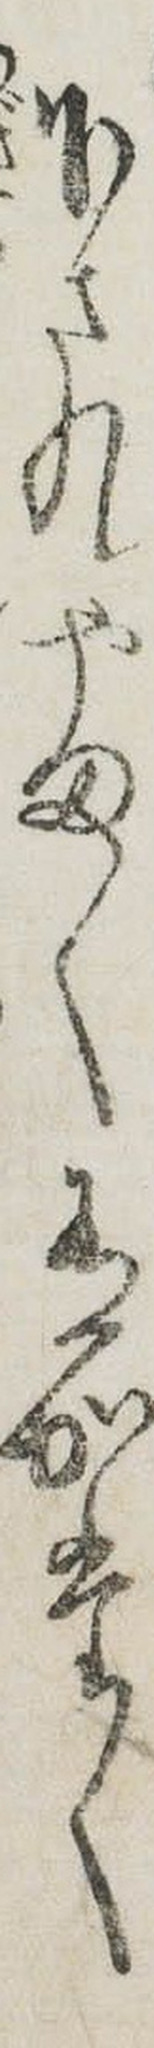下されやま〳〵有がたく
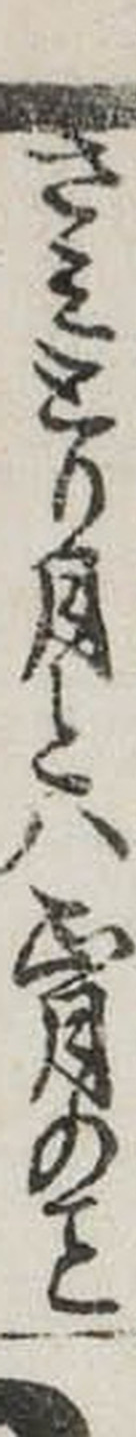さみとり月とは正月のこと
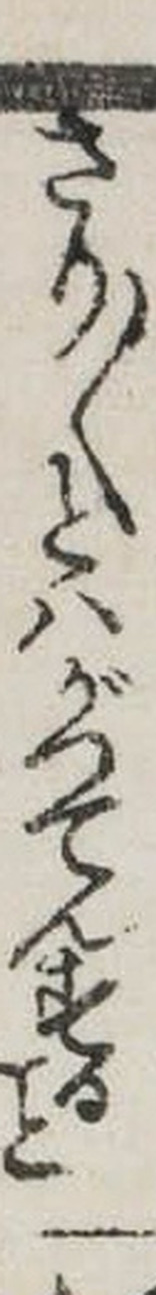さり〳〵とはがつてんすること
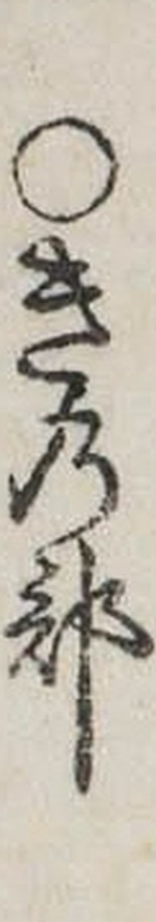○きの部
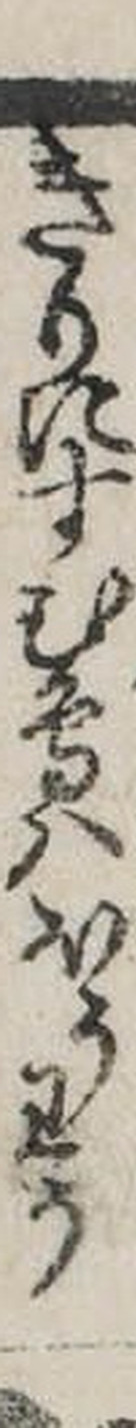きりにすむ鳥はほうわう
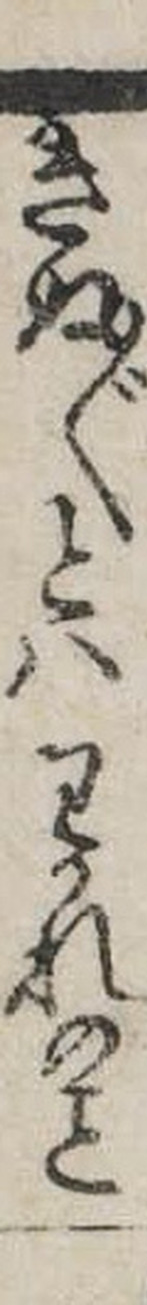きぬ〴〵とはわかれのこと

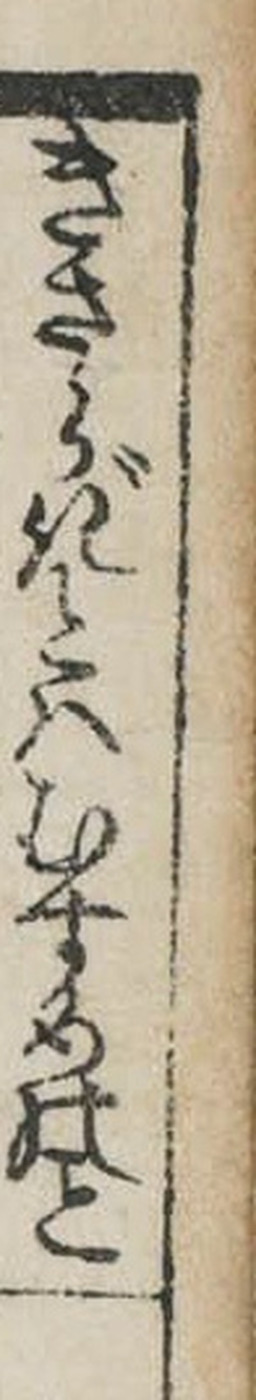きさらぎとはむすめのこと
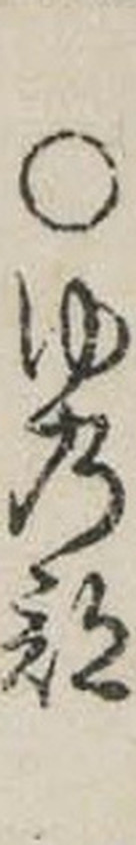○ゆの部
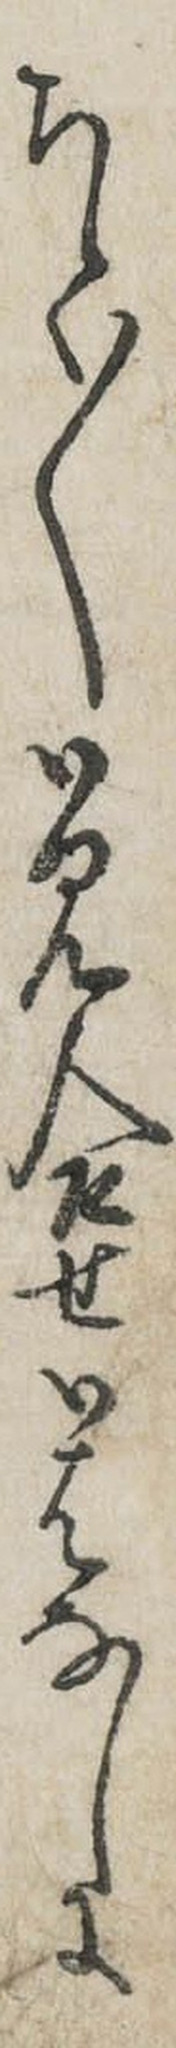ちと〳〵御見合せ御はなしに
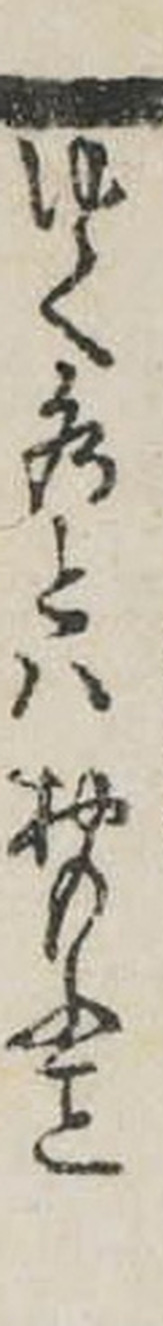ゆく水とはおもふこと
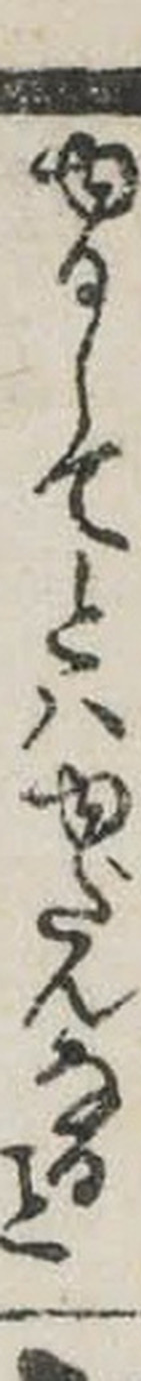ゆるしてとはゆだんなること
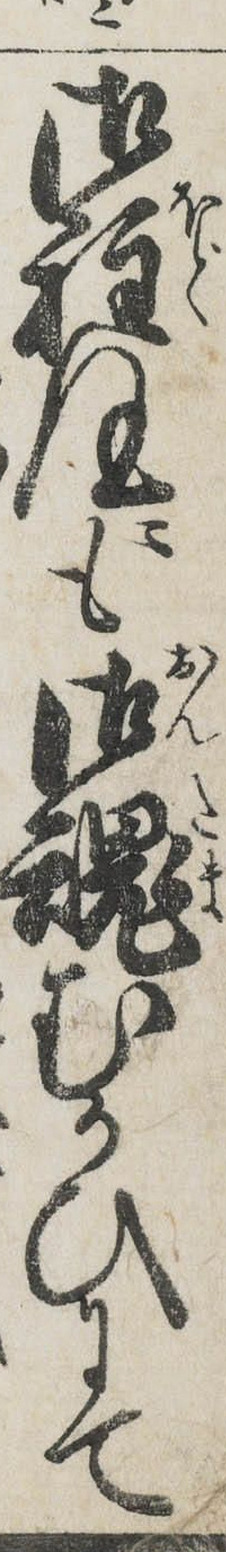御程さまにも御魂むかひにて
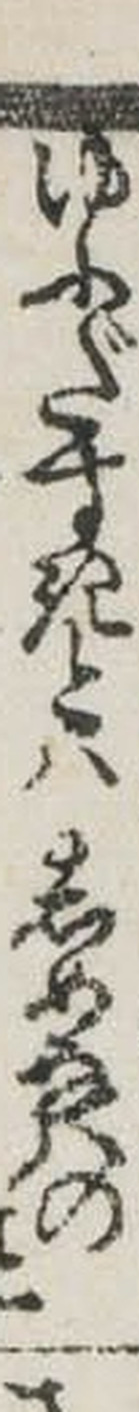ゆふだすきとはしめなはのこと
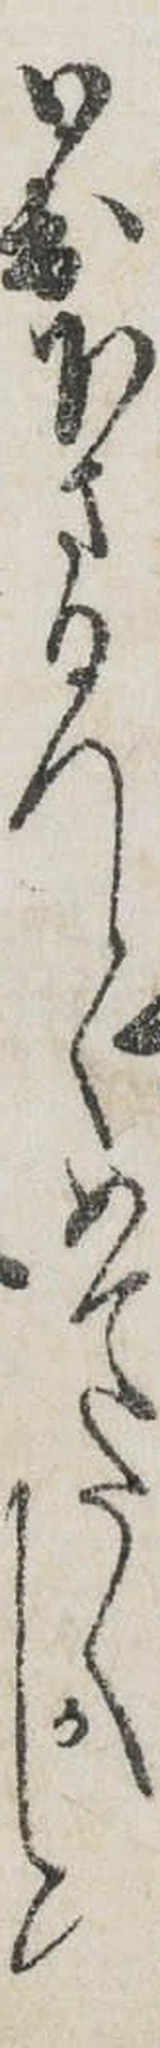御出くださるべく候めてたくかしく
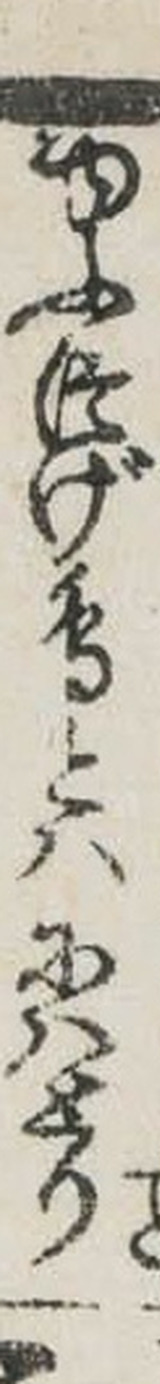ゆふつげ鳥とはにはとり
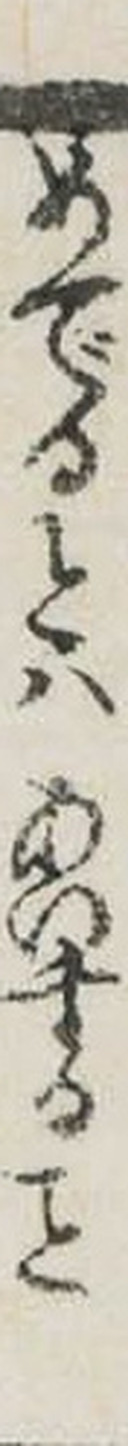めでるとはあいすること
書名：頭書萬用婦人手紙之文言
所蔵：東京学芸大学教育コンテンツアーカイブ
